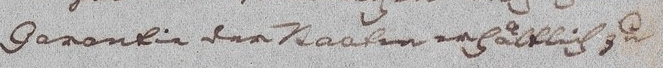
Garantie der Staaten erhältlich zu
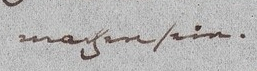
machen sein.
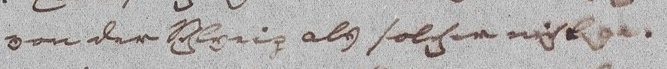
von der Schweiz als solcher nicht ge-
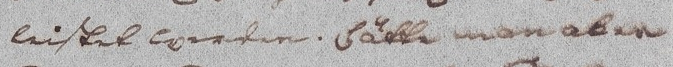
leistet werden. Hätte man aber
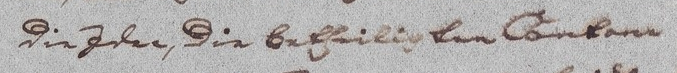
die Idee, die betheiligten Cantone
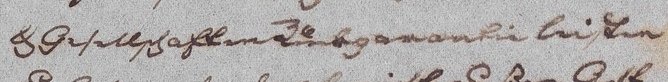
& Gesellschaften Rückgarantie leisten
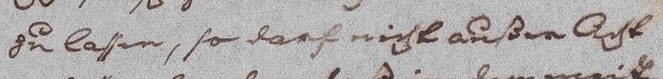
zu lassen, so darf nicht außer Acht
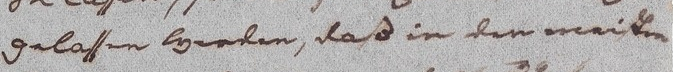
gelassen werden, daß in den meisten
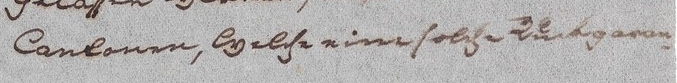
Cantonen, welche eine solche Rückgaran-
